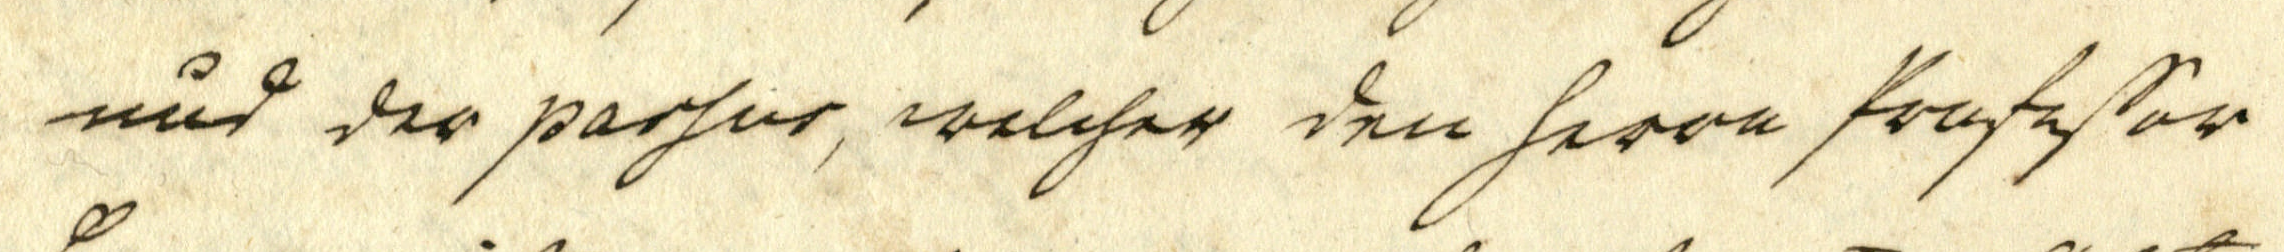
und der passus, welcher den Herrn Professor
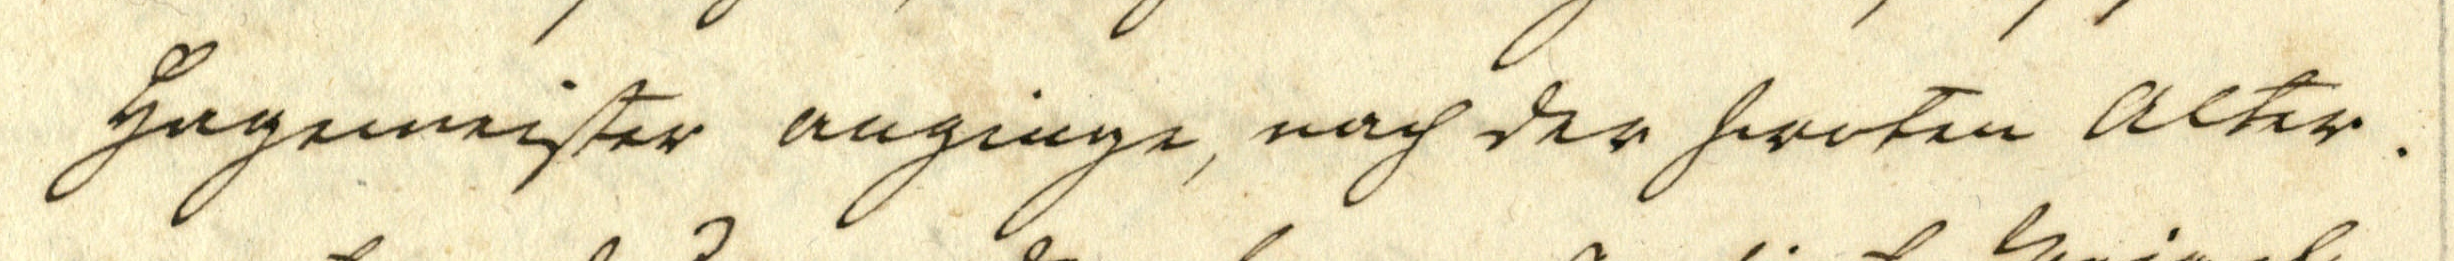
Hagemeister anginge, nach der zwoten Alter¬
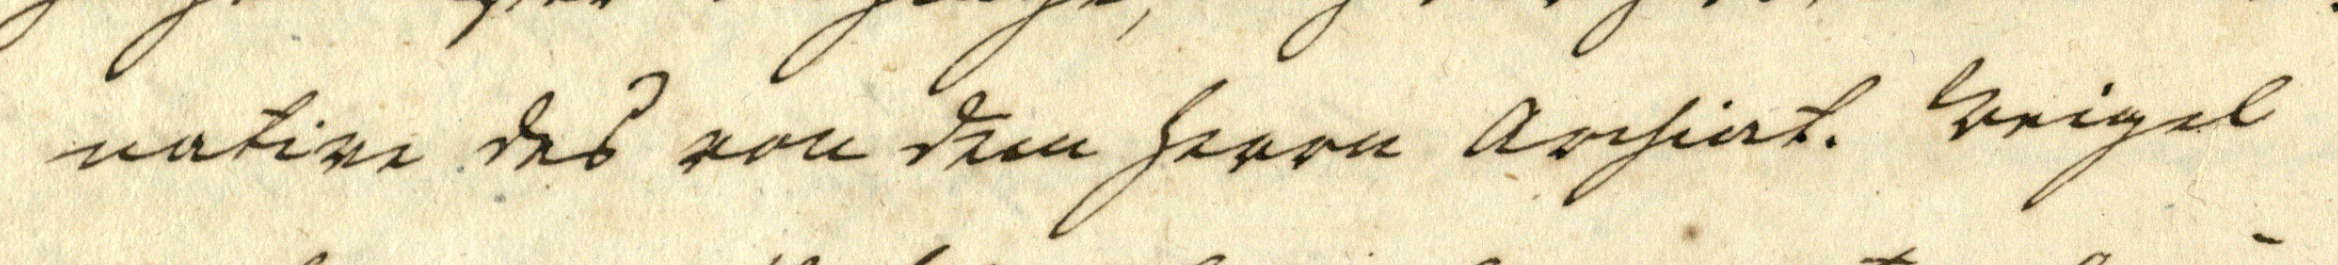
native des von dem Herrn Archiat. Weigel
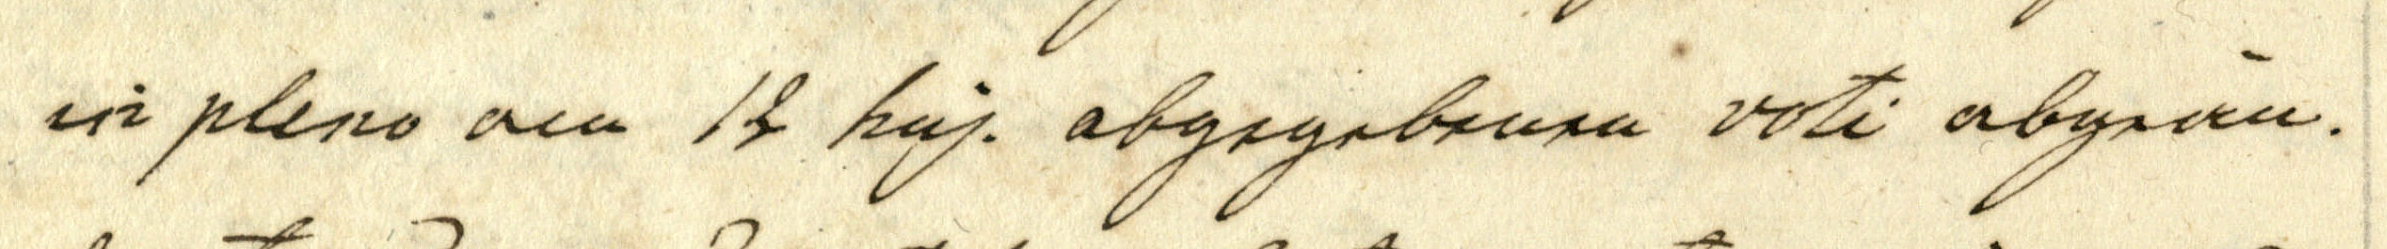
in pleno am 12 huj. abgegebenen voti abgeän¬
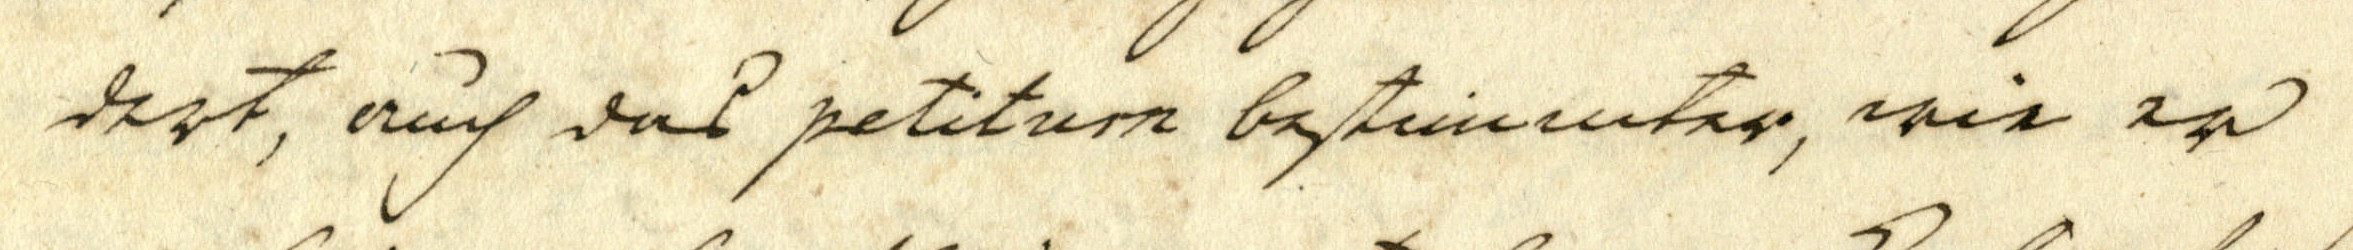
dert, auch das petitum bestimmter, wie er
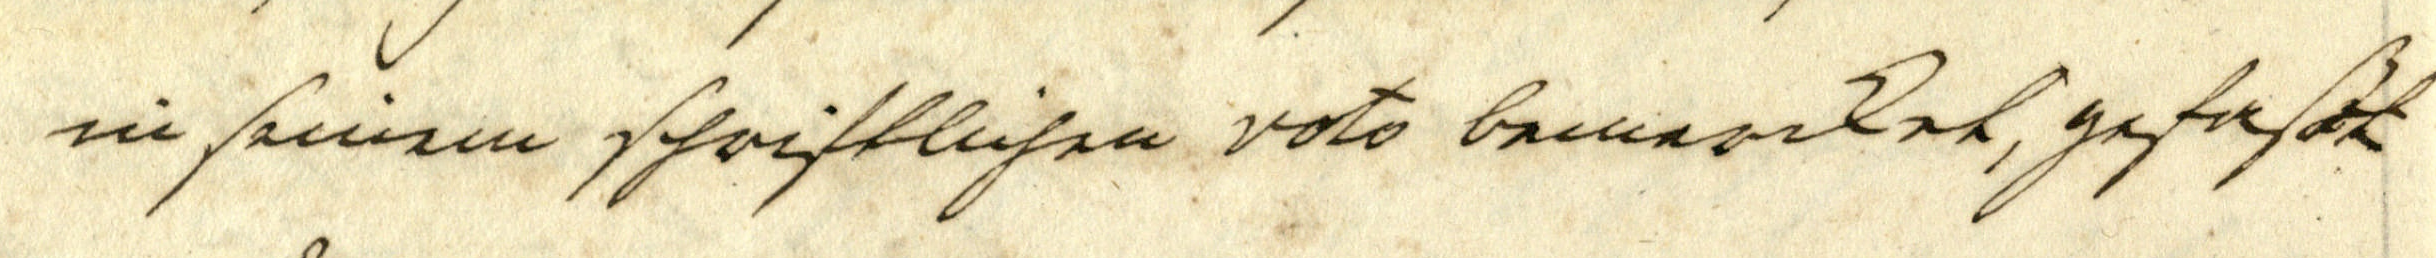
in seinem schriftlichen voto bemercket, gefasset
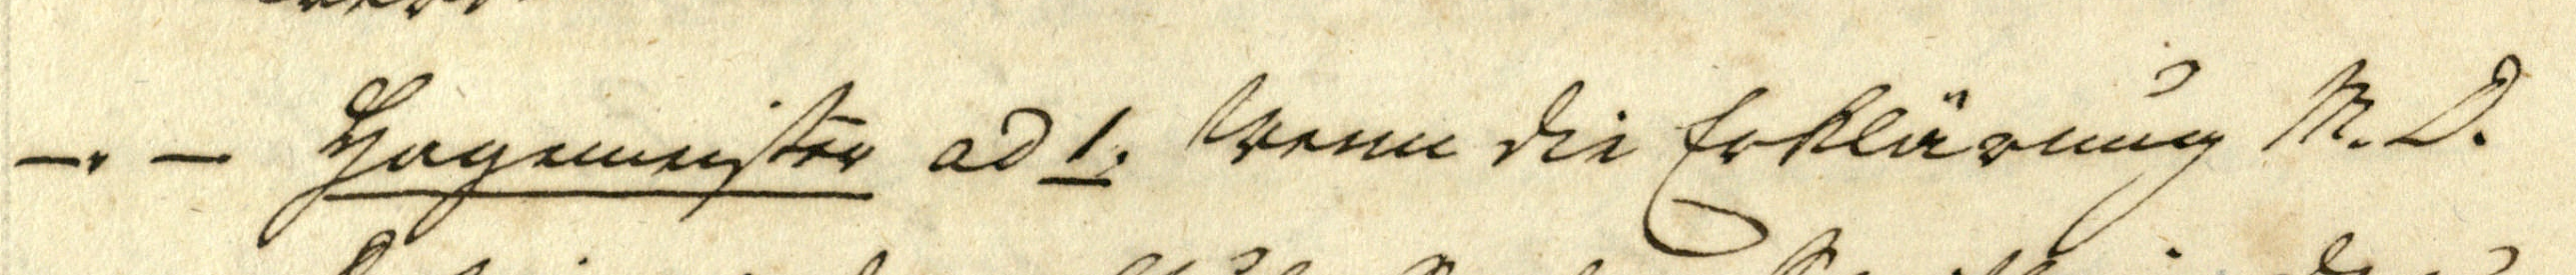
Hagemeister ad 1. Wenn die Erklärung M. D.
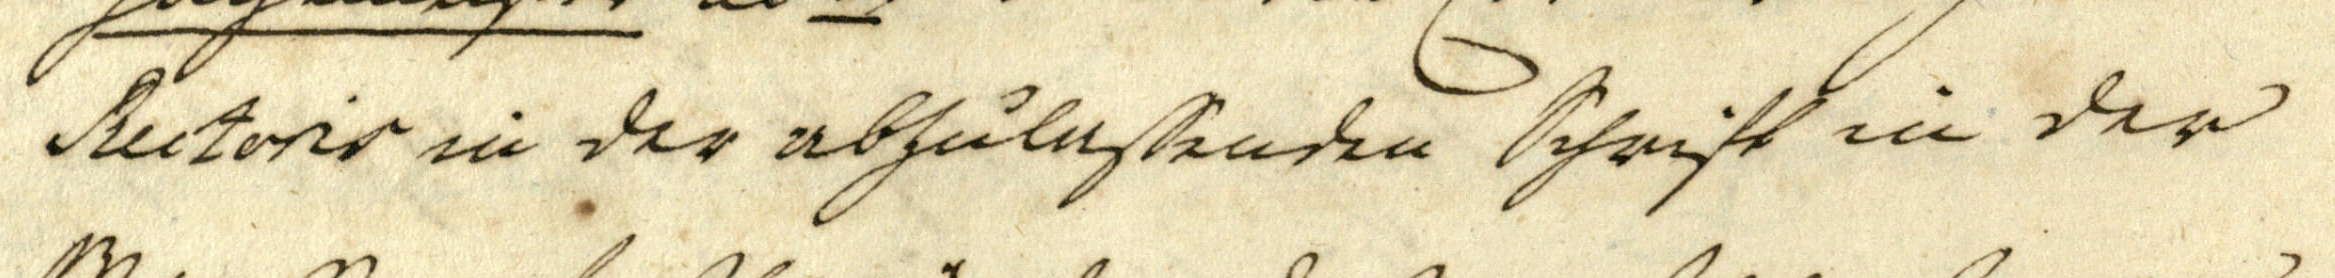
Rectoris in der abzulassenden Schrift in der
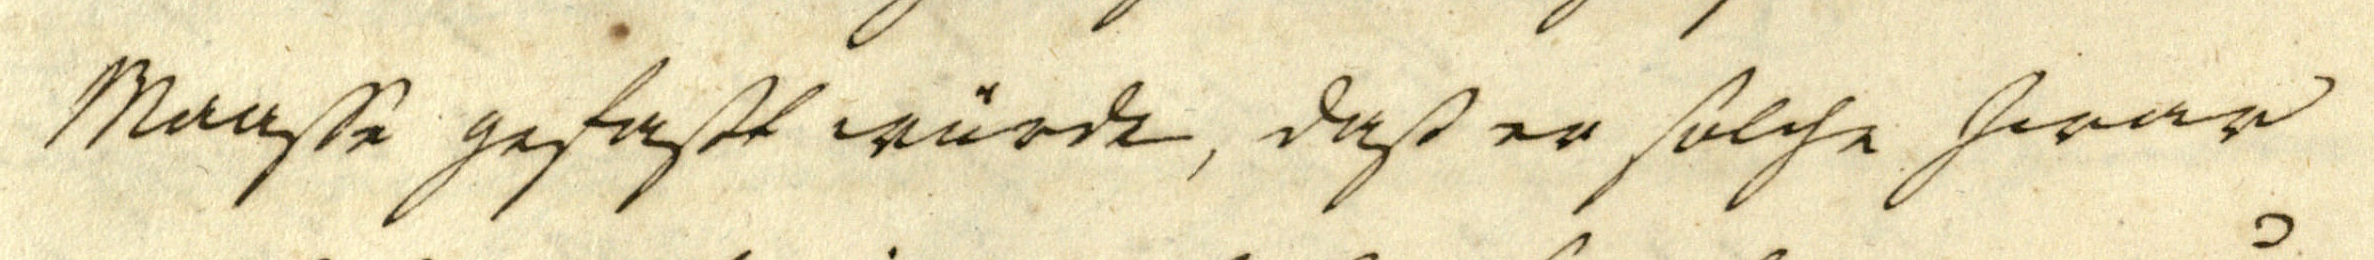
Maasse gefaßt würde, daß er solche zwar
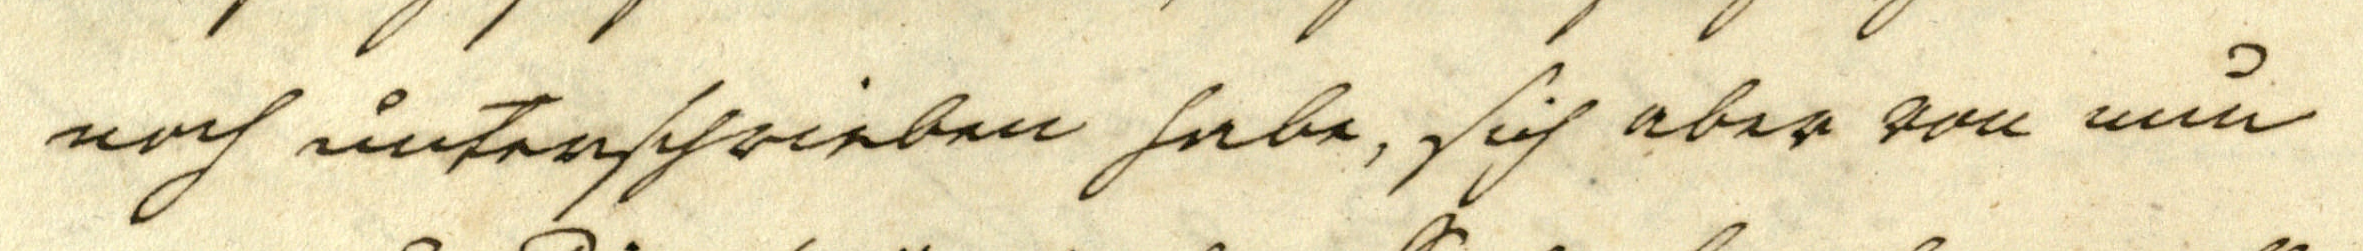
noch unterschrieben habe, sich aber von nun
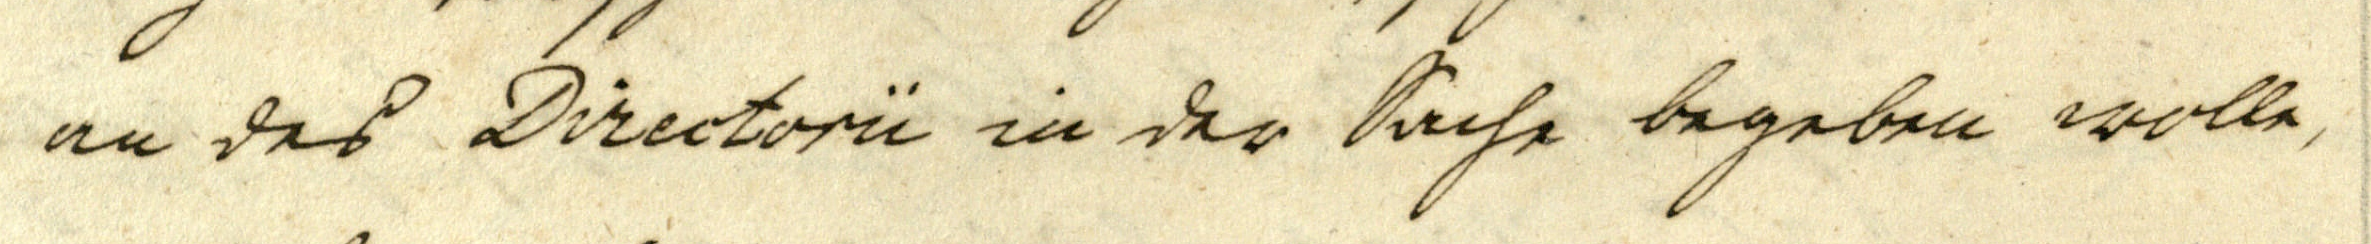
an des Directorii in der Sache begeben wolle,
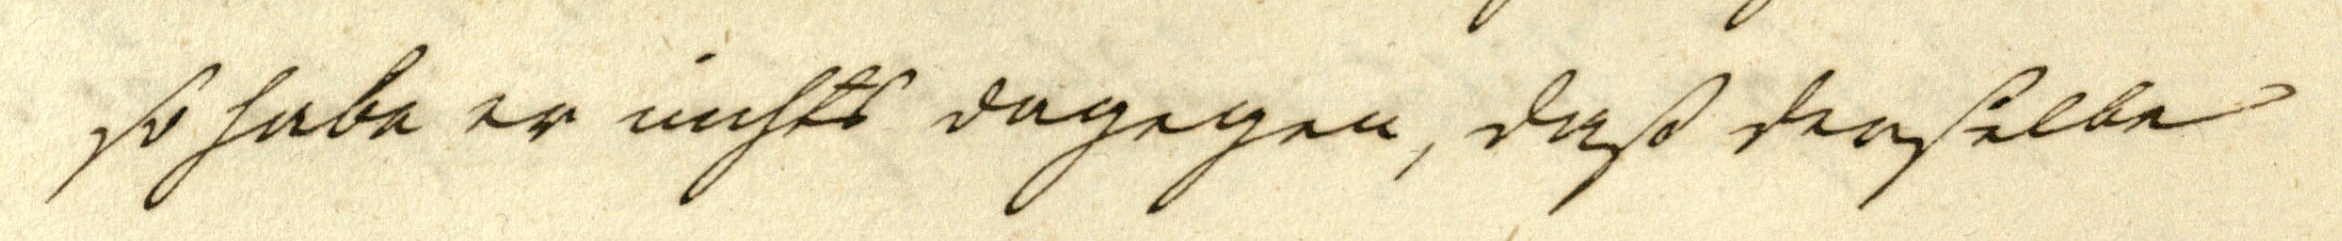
so habe er nichts dagegen, daß derselbe
